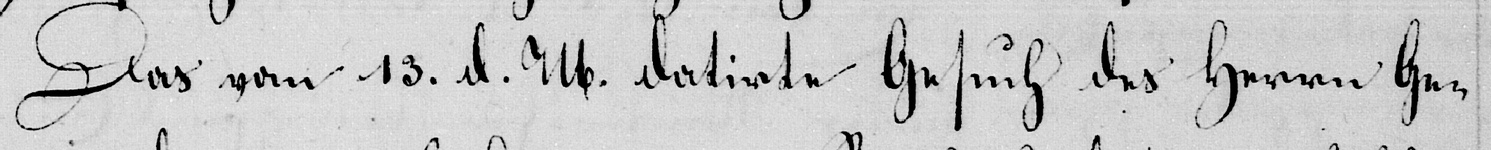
Das vom 13. d. M. datirte Gesuch des Herrn Ge¬
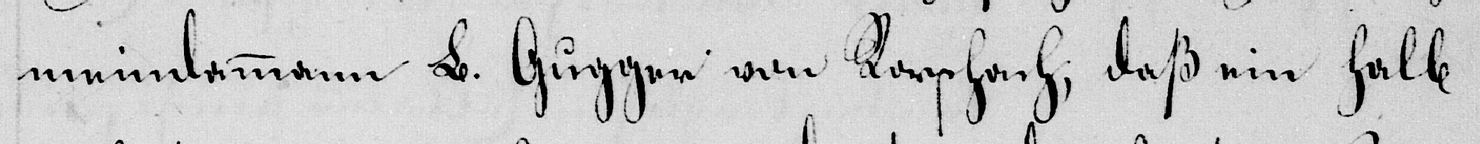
meindammann B. Gugger von Rorschach, daß ein halb
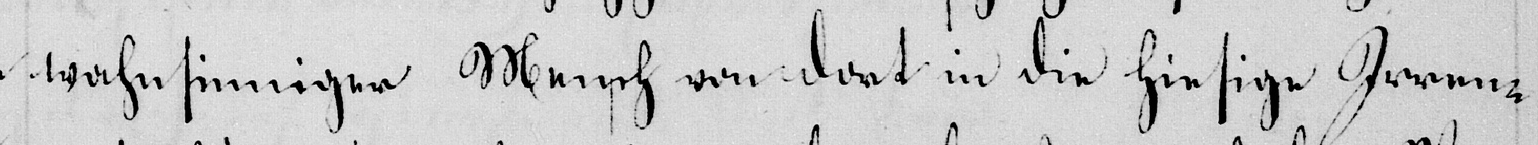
wahnsinniger Mensch von dort in die hiesige Irren¬
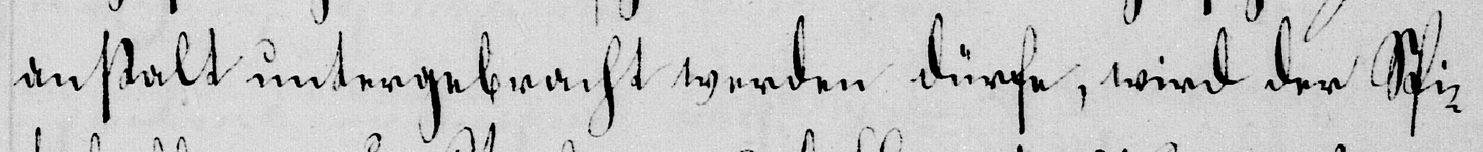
anstalt untergebracht werden dürfe, wird der Spi¬
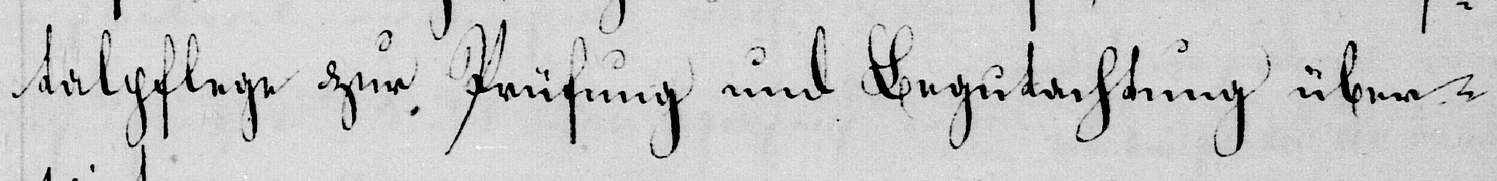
talpflege zur Prüfung und Begutachtung über¬
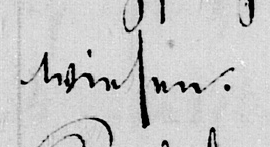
wiesen.
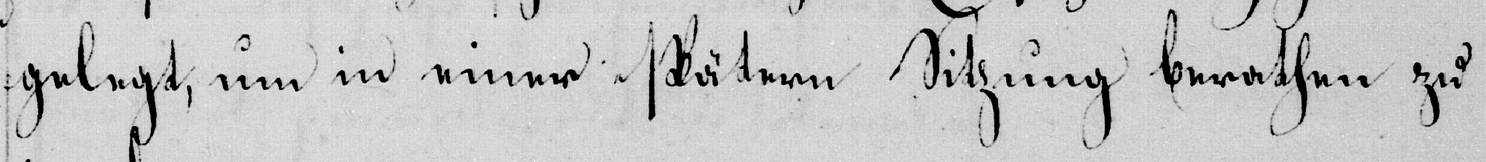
gelegt, um in einer späteren Sitzung berathen zu
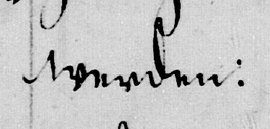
werden:
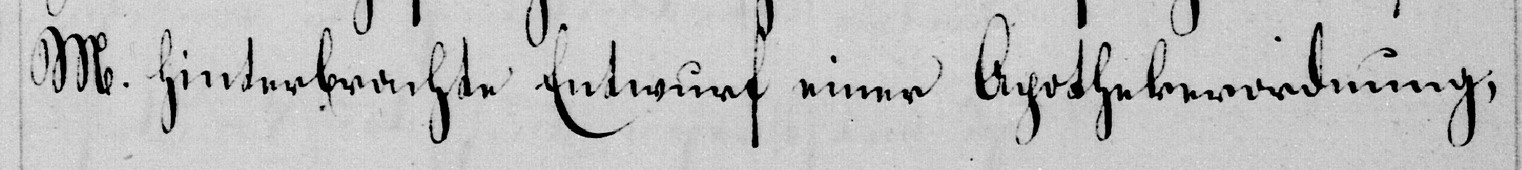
M. hinterbrachte Entwurf einer Apothekerordnung,
